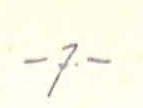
7.
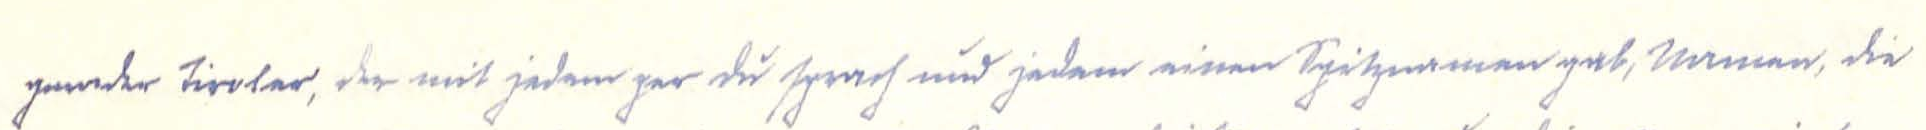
gerader Tiroler, der mit jedem per du sprach und jedem einen Spitznamen gab, Namen, die
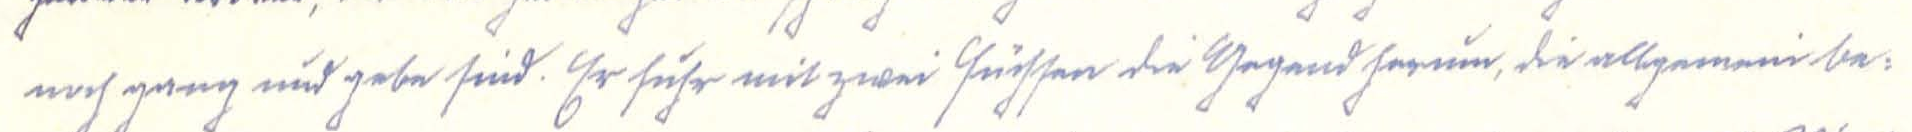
noch gang und gebe sind. Er fuhr mit zwei Füchsen die Gegend herum, die allgemein ge-
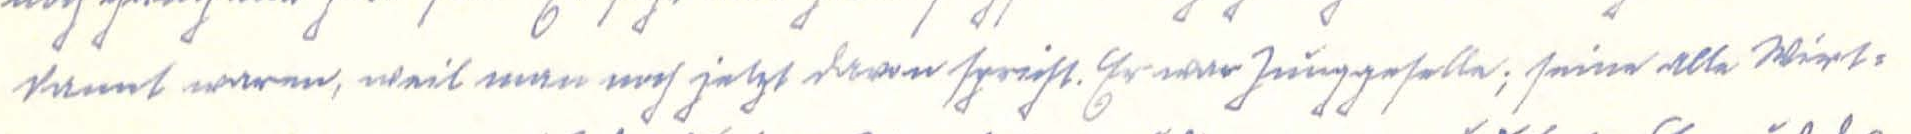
kannt waren, weil man noch jetzt davon spricht. Er war Junggeselle; seine alte Wirt-
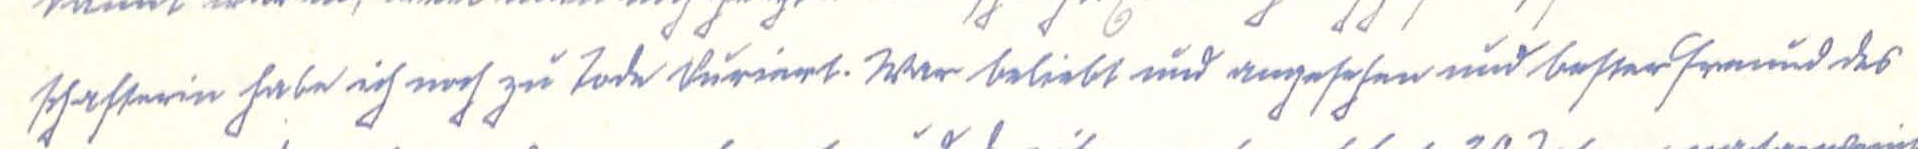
schafterin habe ich noch zu Tode kuriert. War beliebt und angesehen und bester Freund des
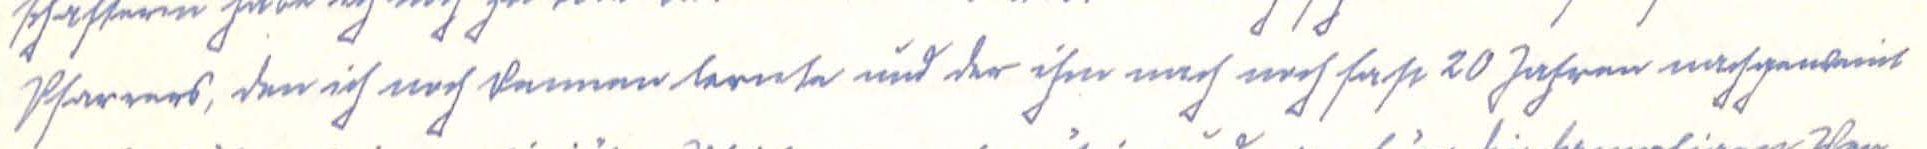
Pfarrers, den ich noch kennen lernte und der ihm nach noch fast 20 Jahren nachgeweint
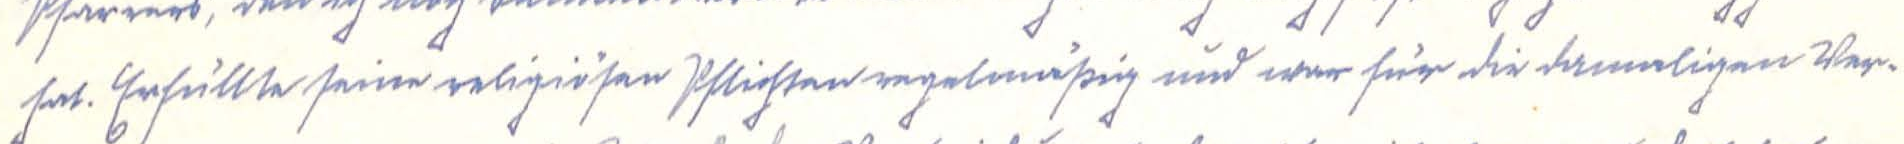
hat. Erfüllte seine religiösen Pflichten regelmäßig und war für die damaligen Ver-
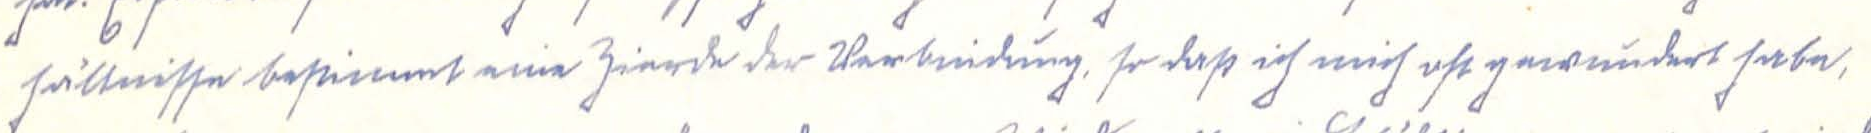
hältnisse bestimmt eine Zierde der Verbindung so daß ich mich oft gewundert habe,
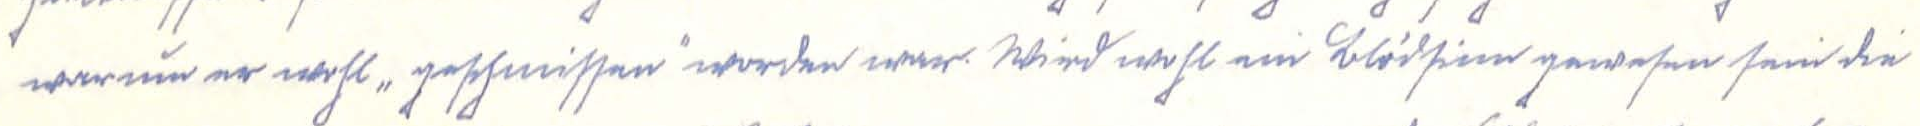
warum er wohl "geschmissen" worden war. Wird wohl ein Blödsinn gewesen sein die
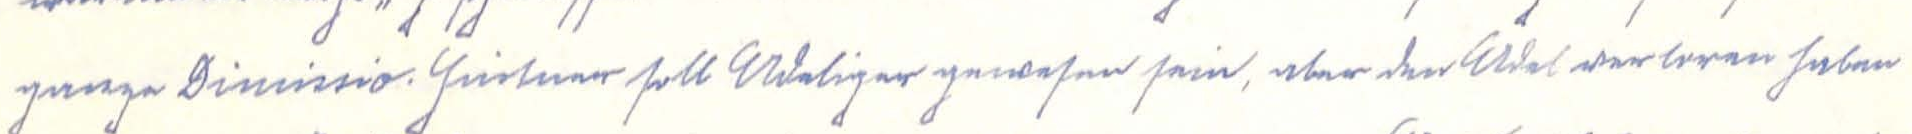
ganze Dimisso. Hintner soll Adeliger gewesen sein, aber der Adel war verloren Jedem
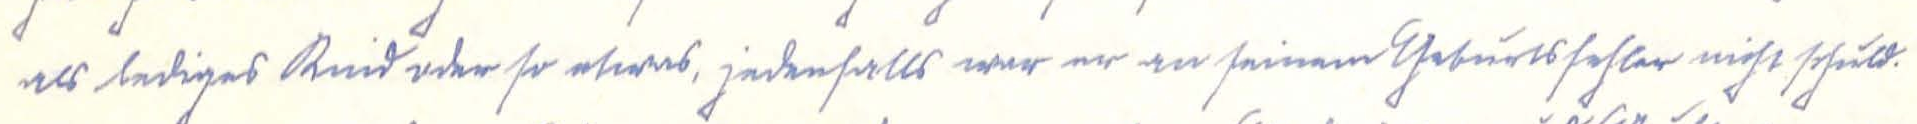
als lediges Kind oder so etwas, jedenfalls war er an seinem Geburtsfehler nicht schuld.
